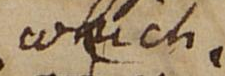which
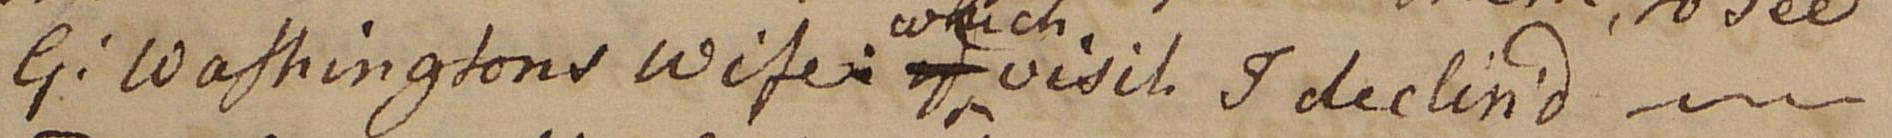G: Washingtons wife [of] ^ visit I declin'd-
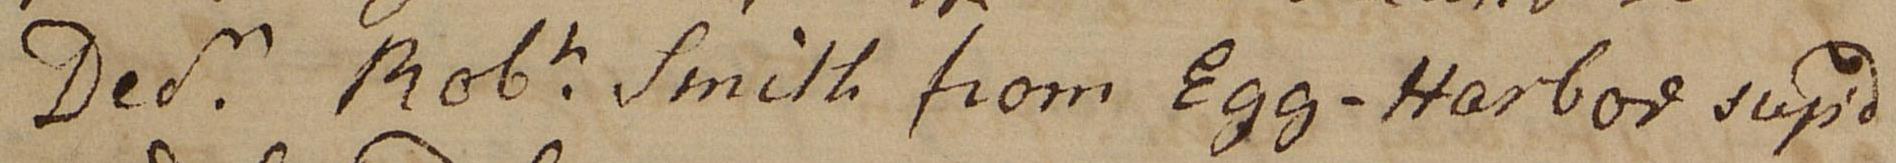Dec^r. Rob^t. Smith from Egg-Harbor sup'd
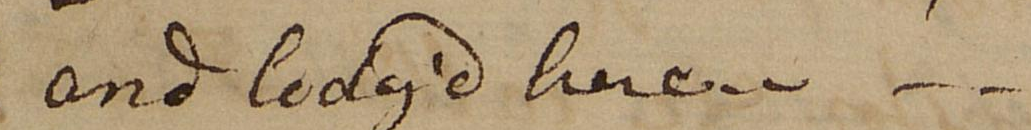and lodg'd here-
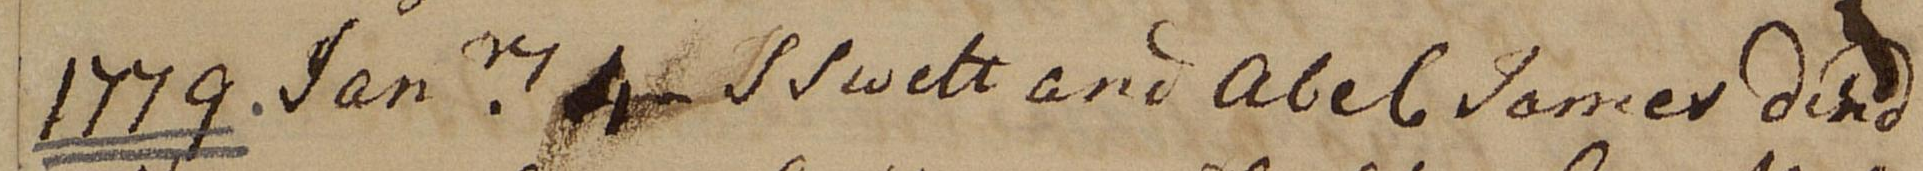1779. Jan^ry. 4 S Swett and Abel James din'd
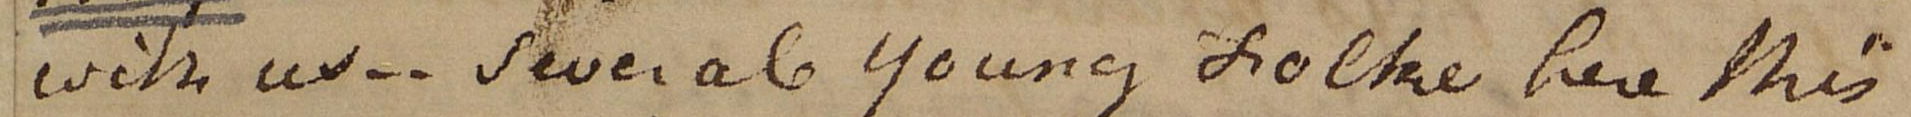with us-- several young Folke here this
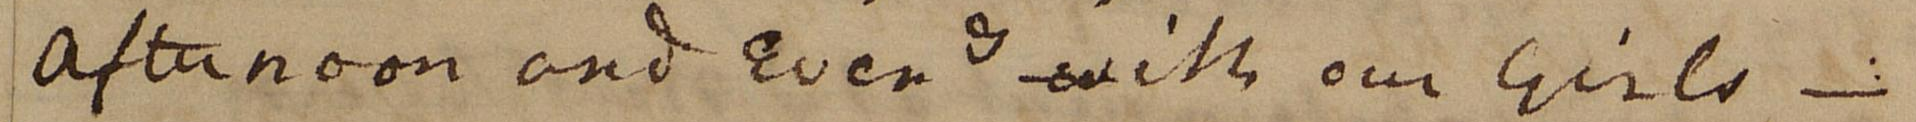afternoon and Even^g with our Girls-
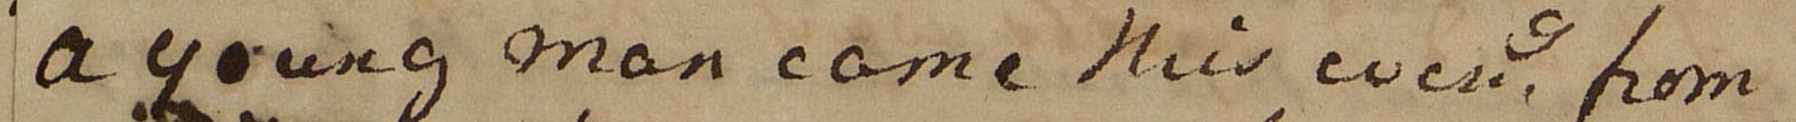a young man came this even^g. from
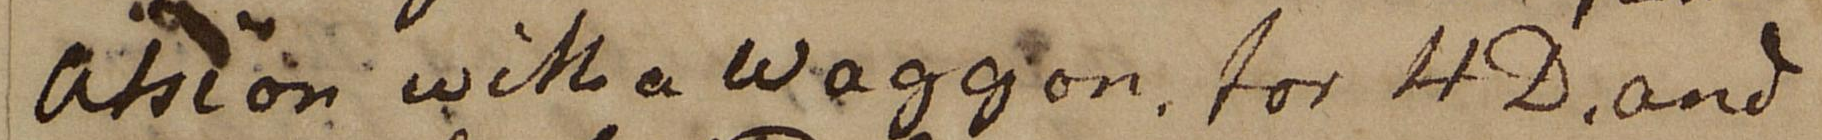Atsion with a Waggon, for HD. and
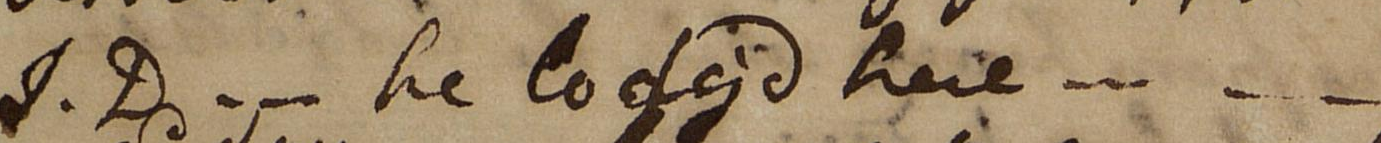I.D-- he lodg'd here-
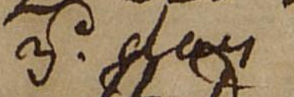3^d. day
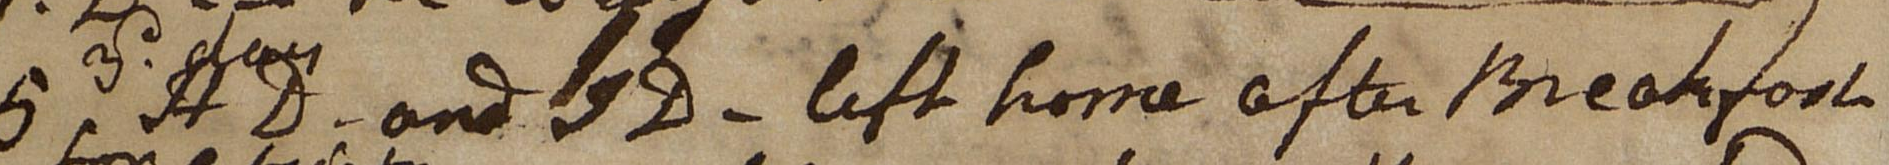5 HD- and ID- left home after Breakfast
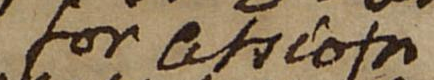for Atsion
